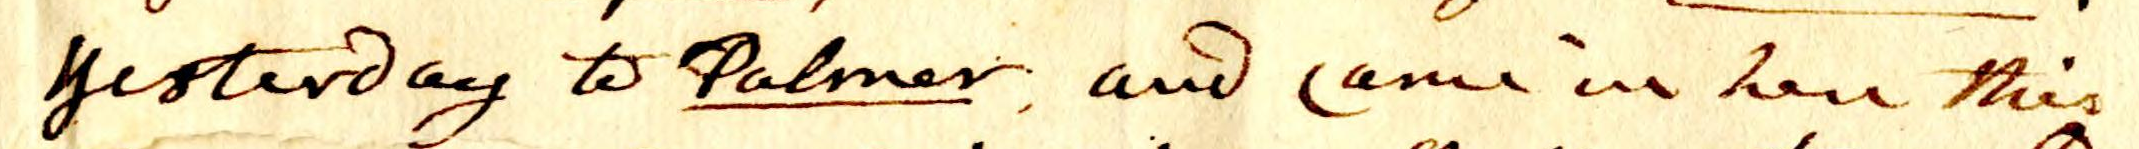Yesterday to Palmer, and came in here this
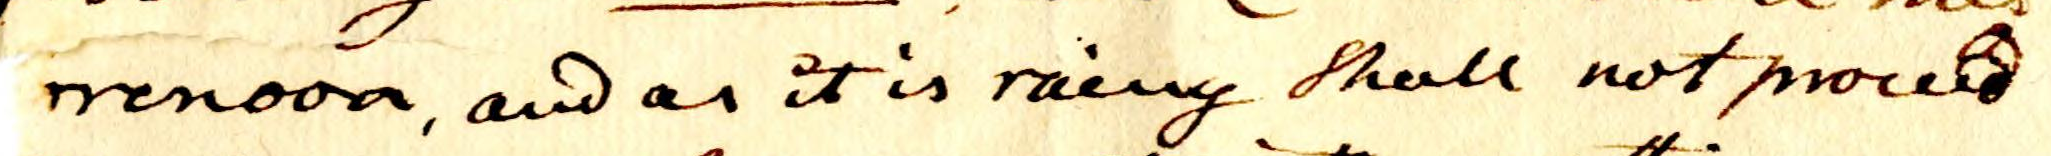orenoon, and as it is rainy shall not proceed
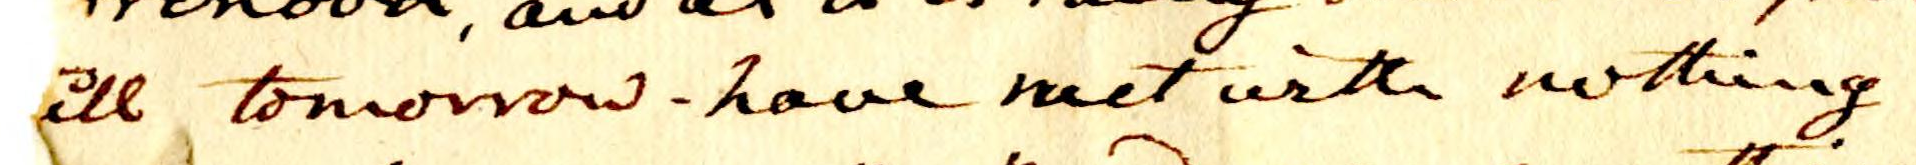ill tomorrow- have met with nothing
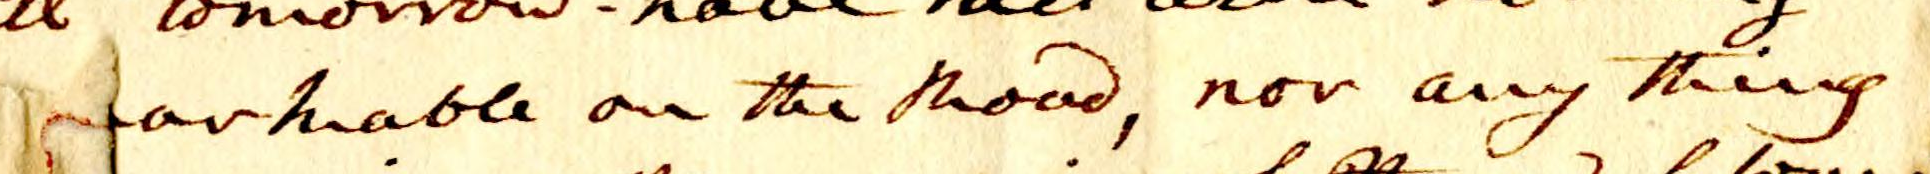arkable on the Road, nor any thing
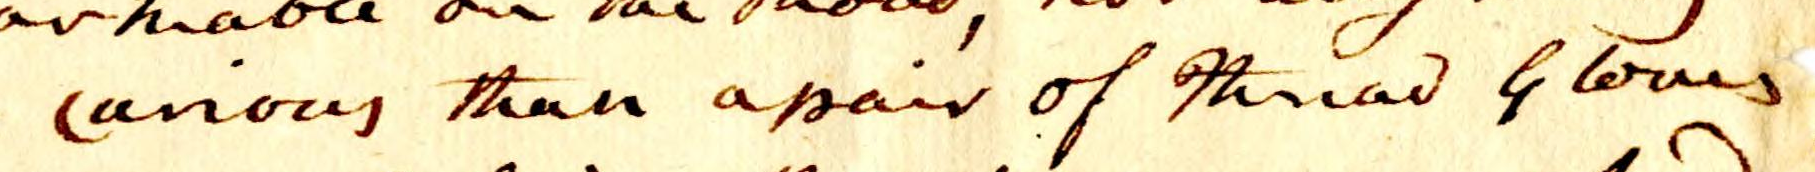curious than a pair of thread Gloves
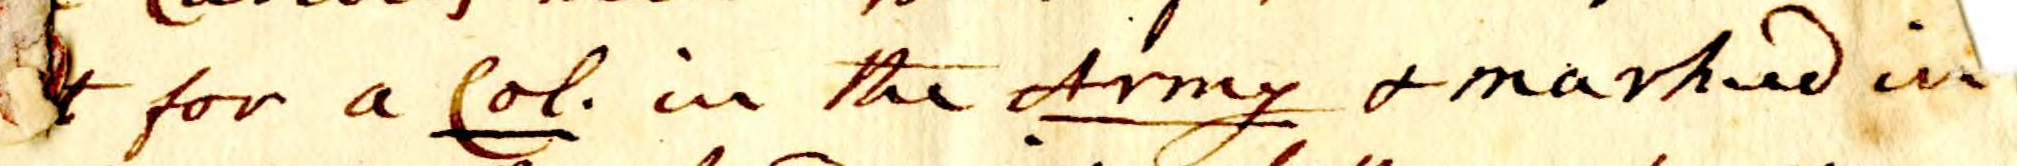for a Col. in the Army & marked in
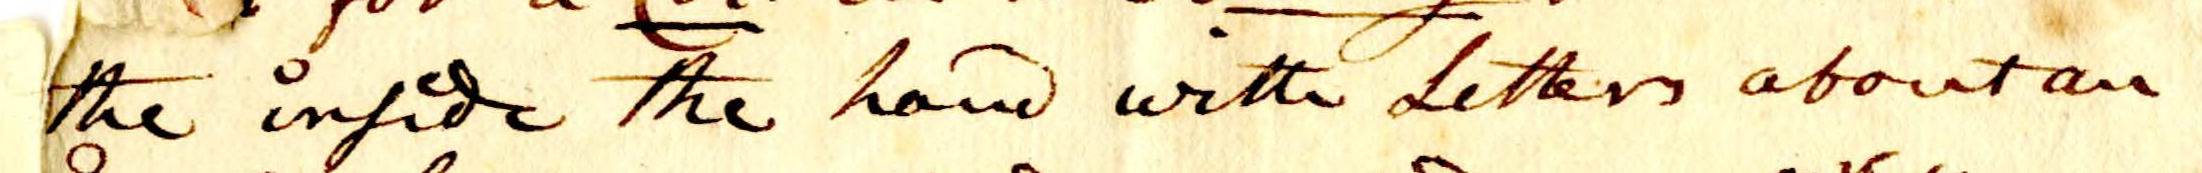the inside the hand with Letters about an
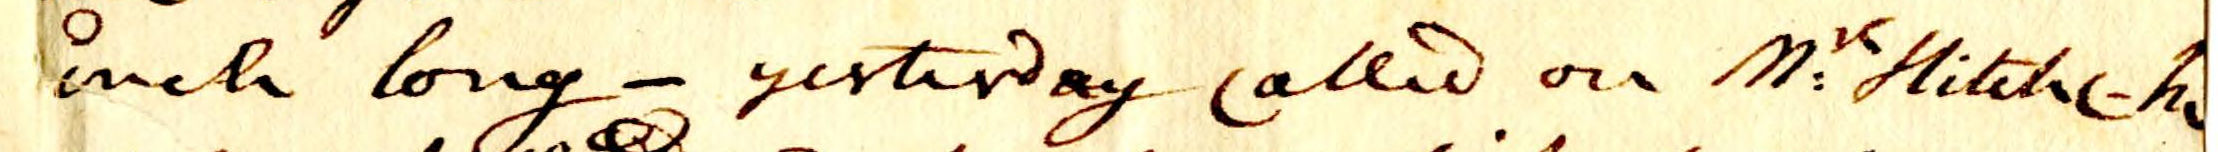inch long- yesterday called on M^r. Hitchc-h
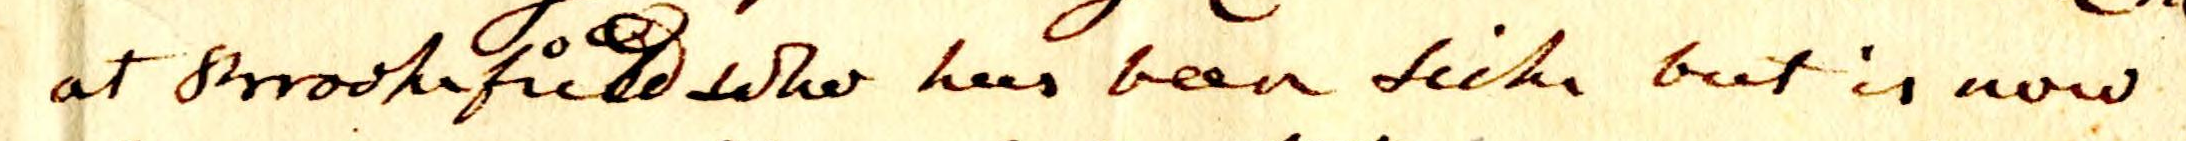at Brookfield Who has been sick but is now
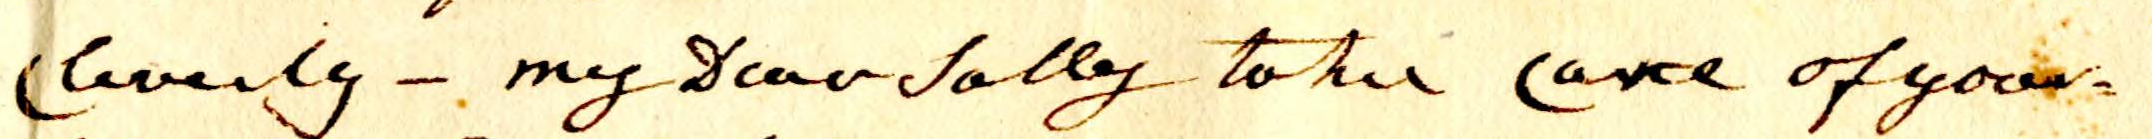Cleverly- my dear Sally take Care of your-
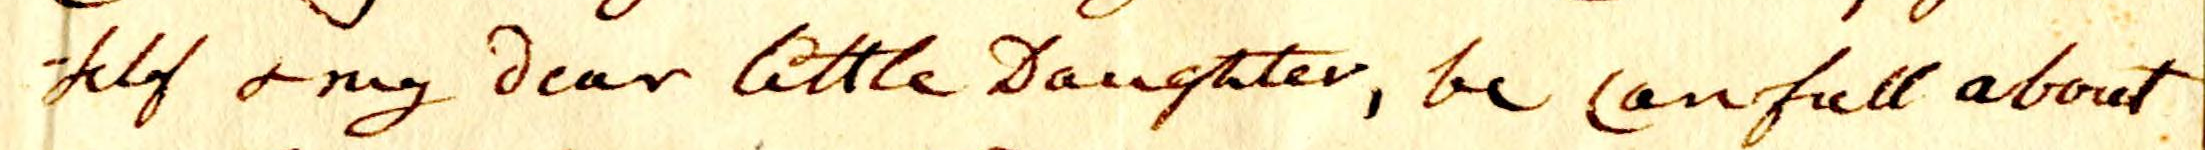self & my dear little Daughter, be carefull about
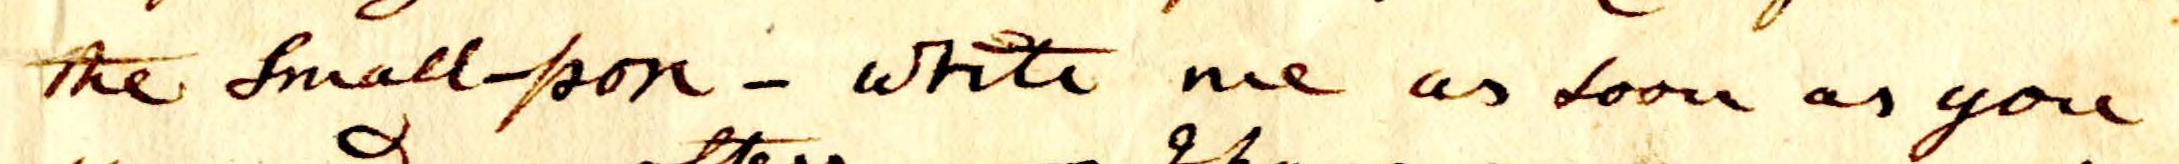the Small-pox- write me as soon as you
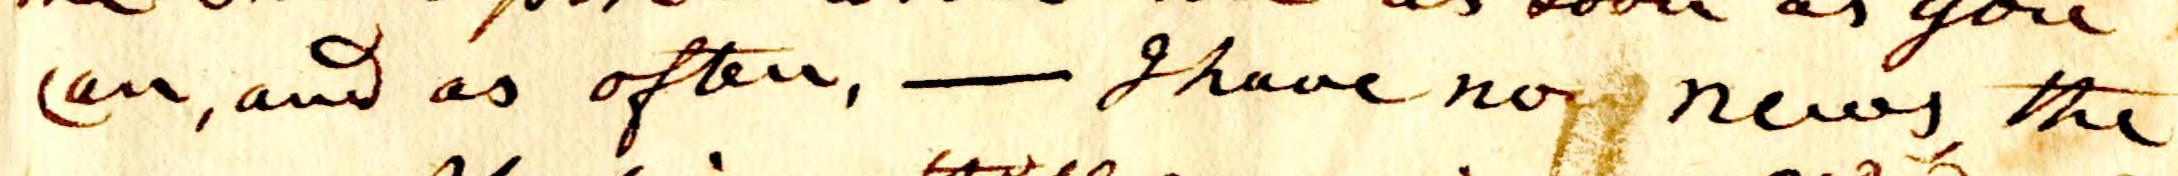can, and as often,- I have no news the
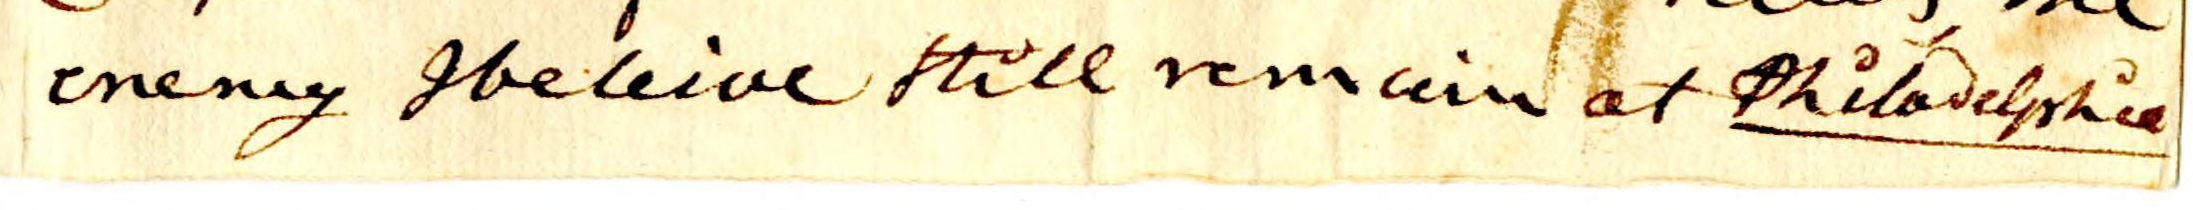enemy I beleive still remain at Philadelphia
